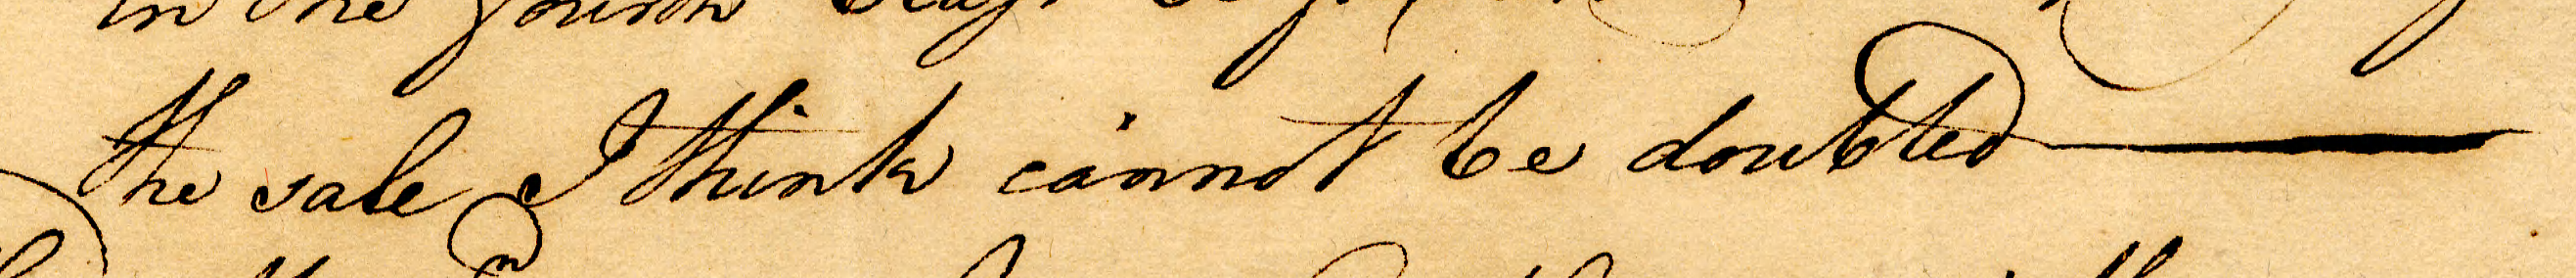the sale I think cannot be doubted-
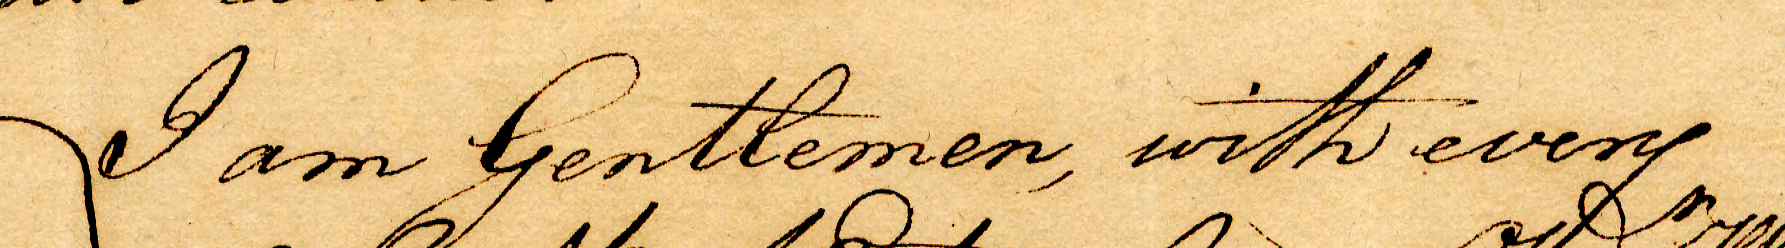I am Gentlemen, with every
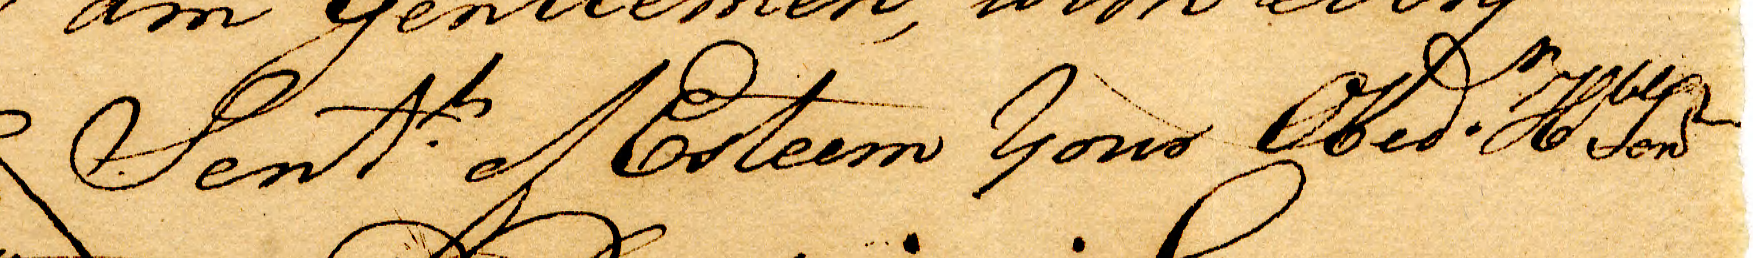Sent^t. of Esteem Your Obed^t. H^ble Serv^t
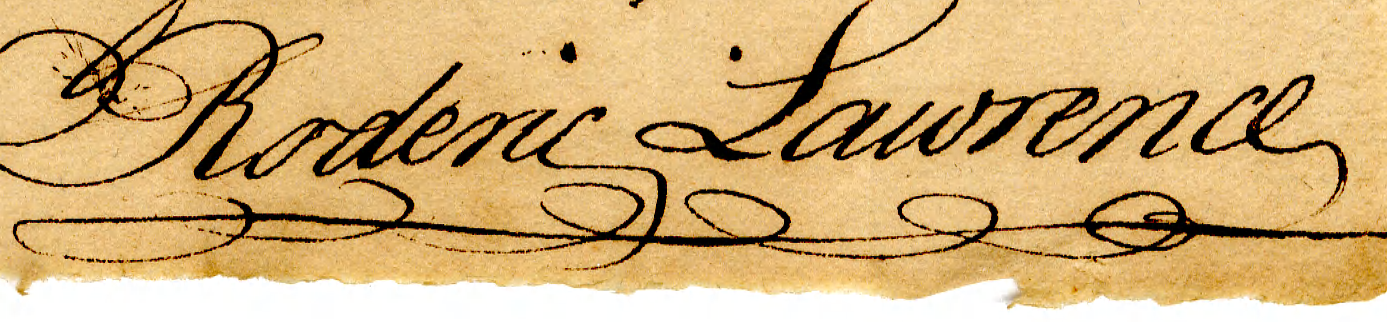Roderic Lawrence
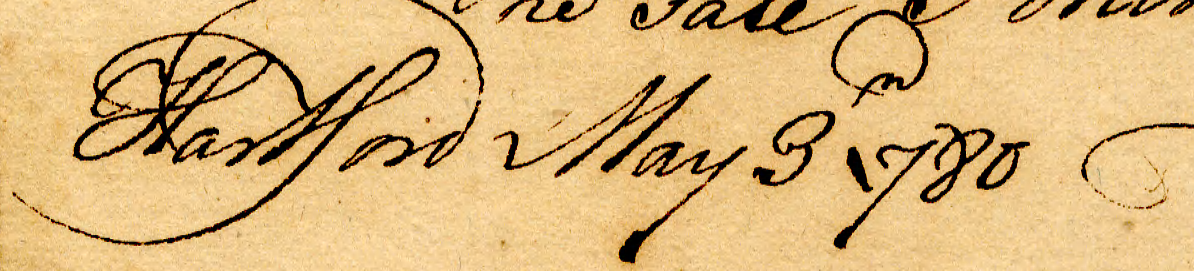Hartford May 3^rd 1780
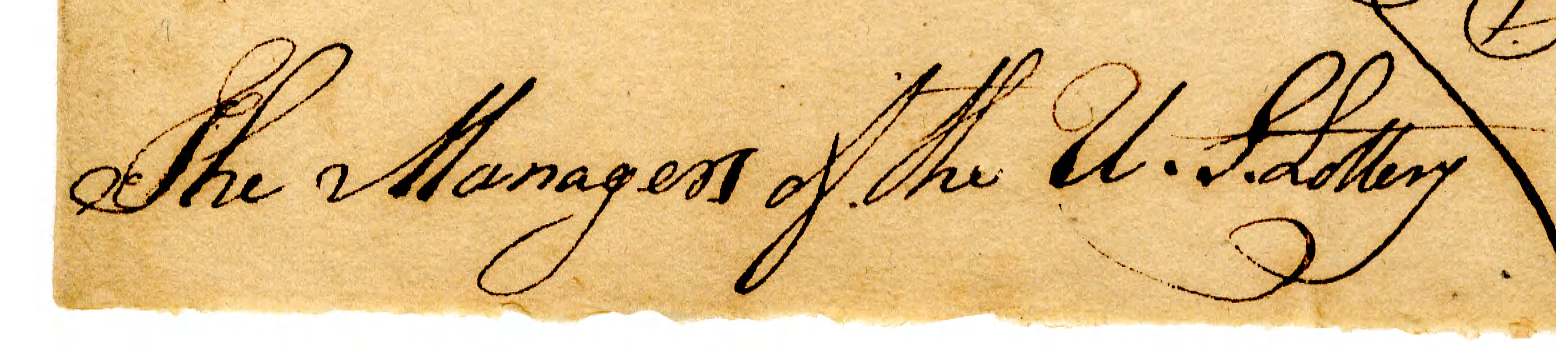The Managers of the U.S. Lottery
